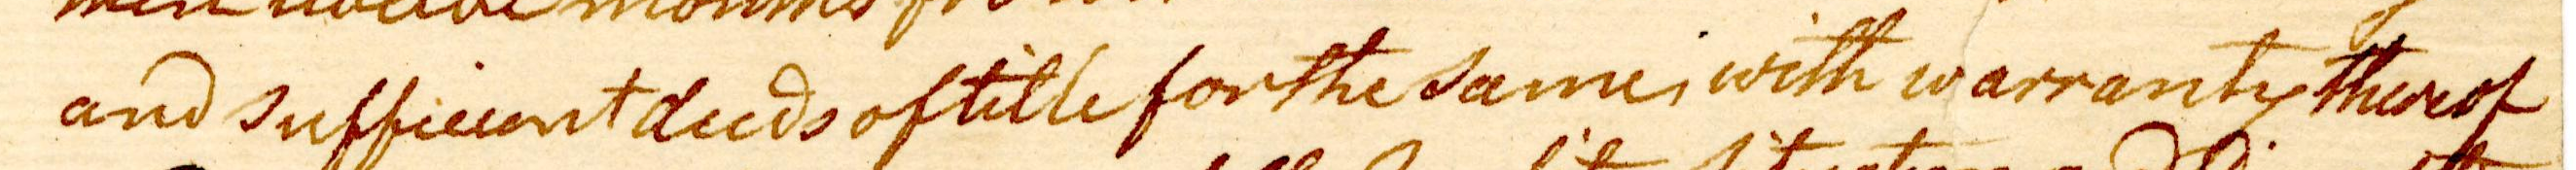and sufficient deeds of title for the same, with warranty thereof
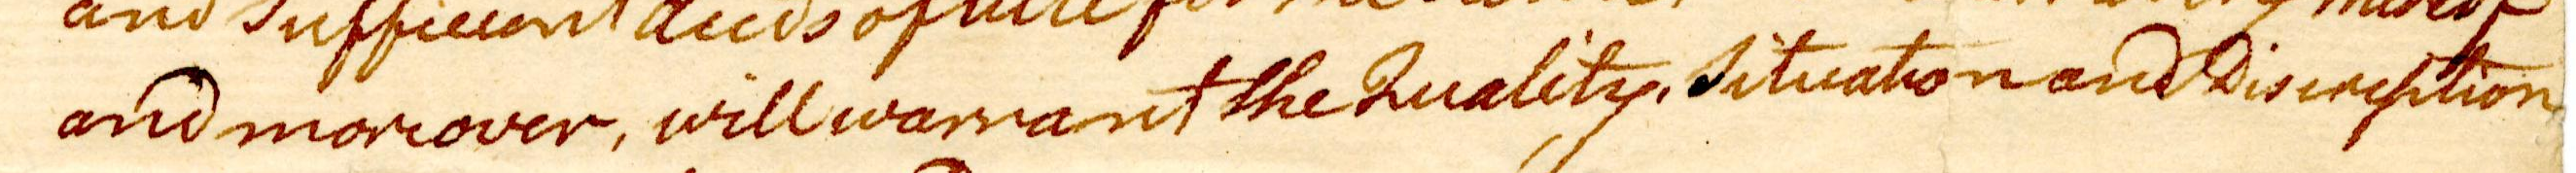and moreover, will warrant the Quality, Situation and Discription
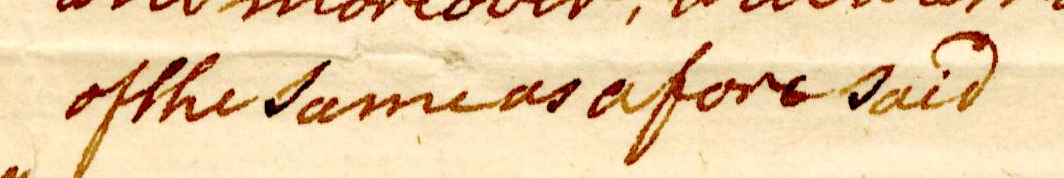of the Same as aforesaid
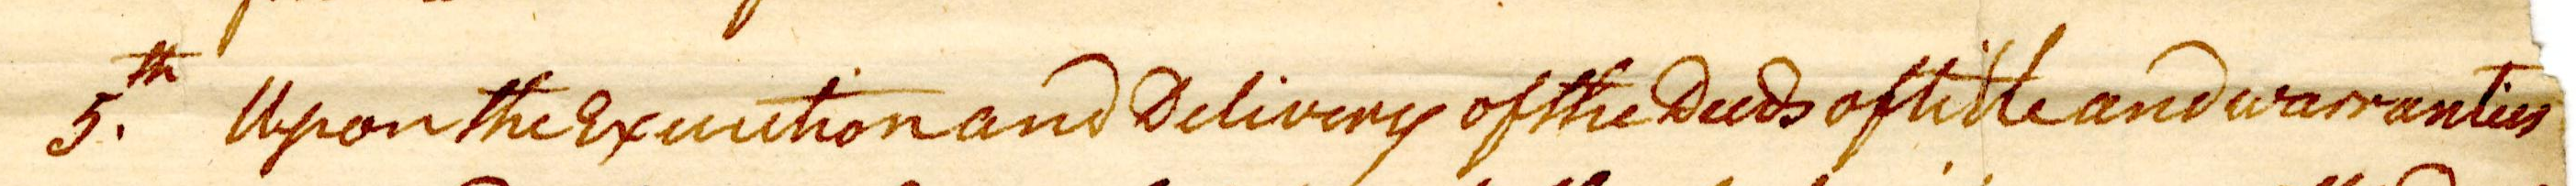5^th. Upon the Execution and delivery of the Deeds of title and warranties
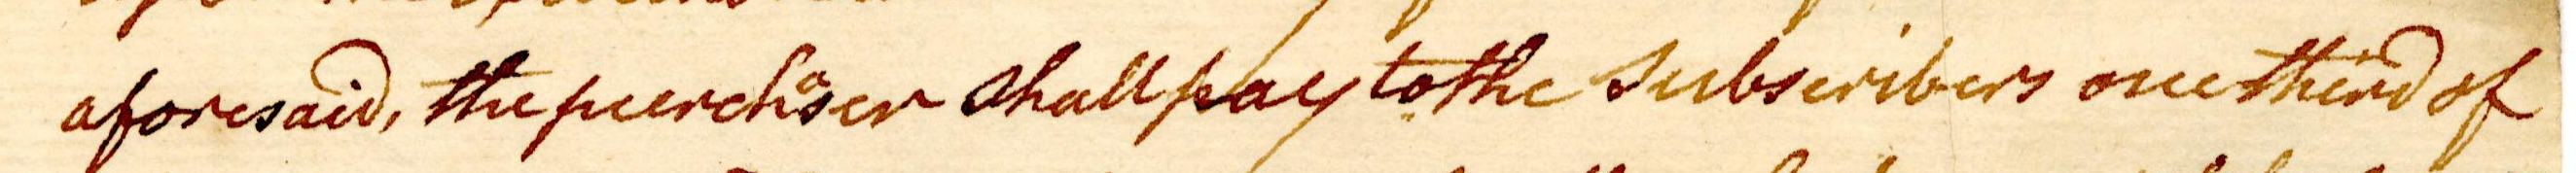aforesaid, the purchaser shall pay to the subscribers one third of
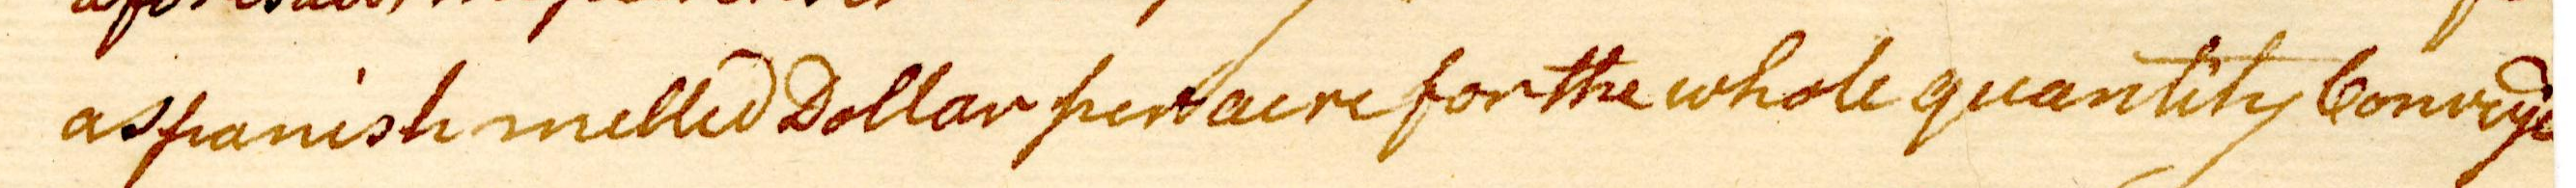a Spanish milled Dollar per acre for the whole quantity Convey'd
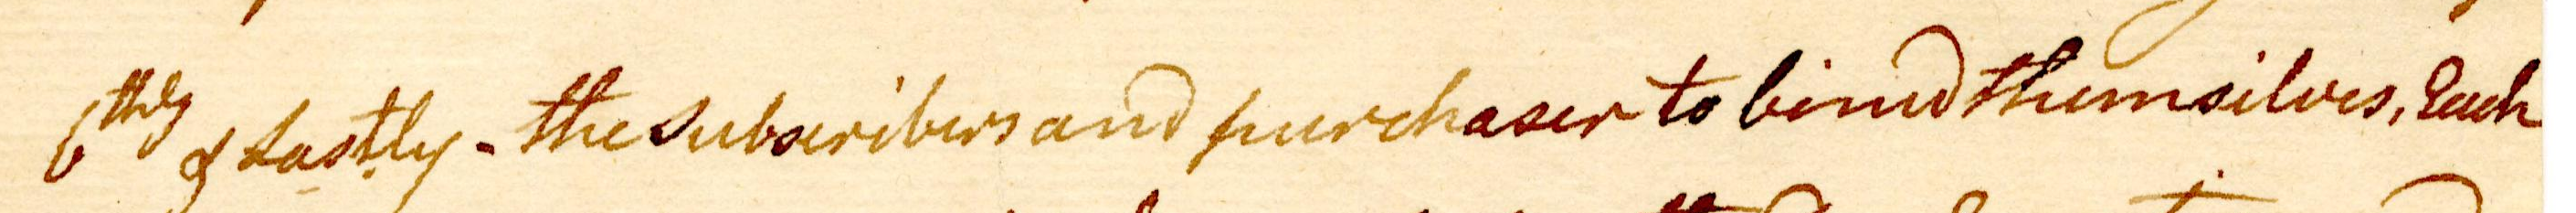6^th & Lastly the subscribers and purchaser to bind themselves, Each
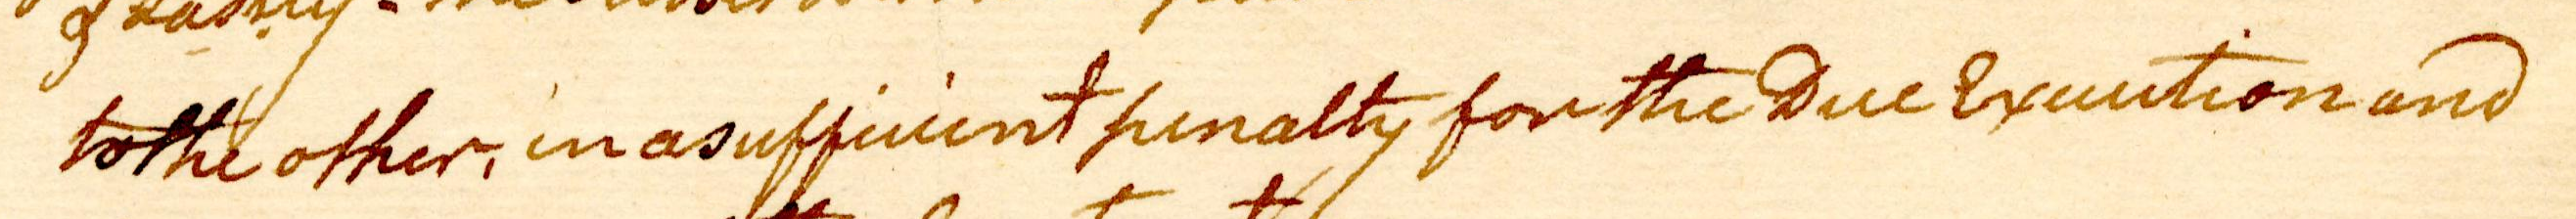to the other in a sufficient penalty for the Due Execution and
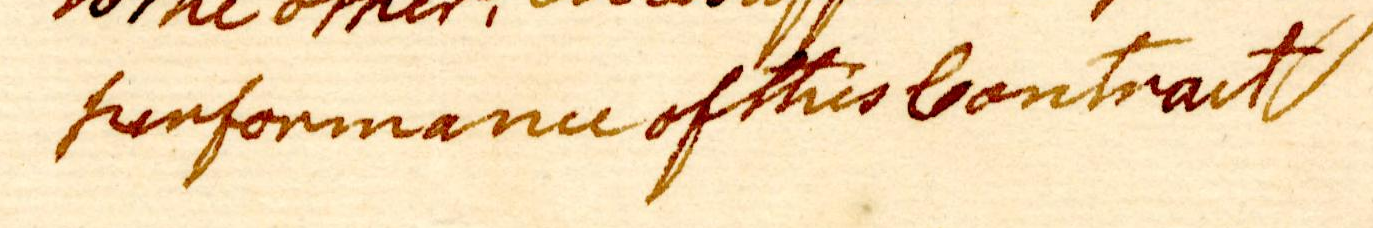performance of this Contract
